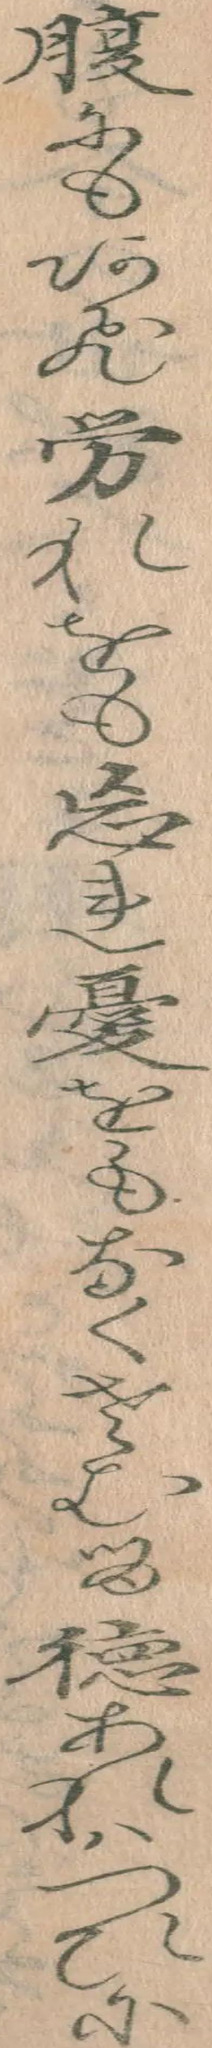腹にもあひ労れをも忘れ憂をもなくさむる徳あれはつひに
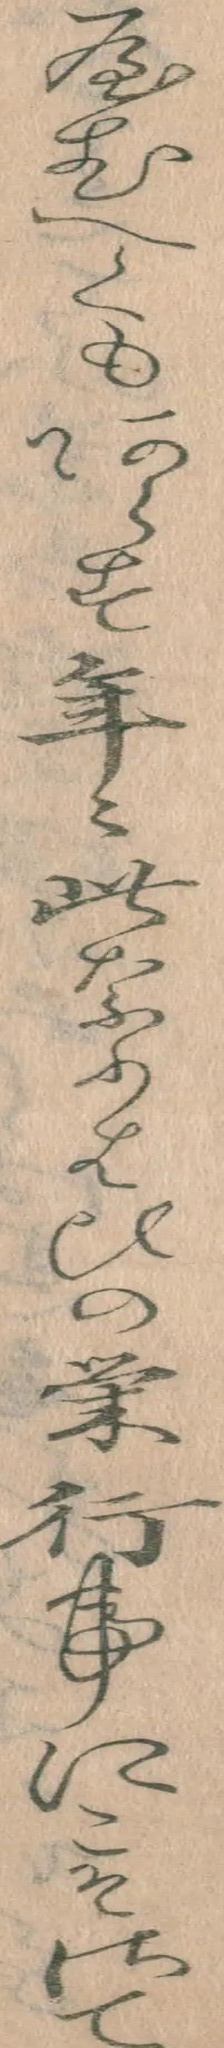やむへくもあらす年々此なりはひの栄行事にこそさて
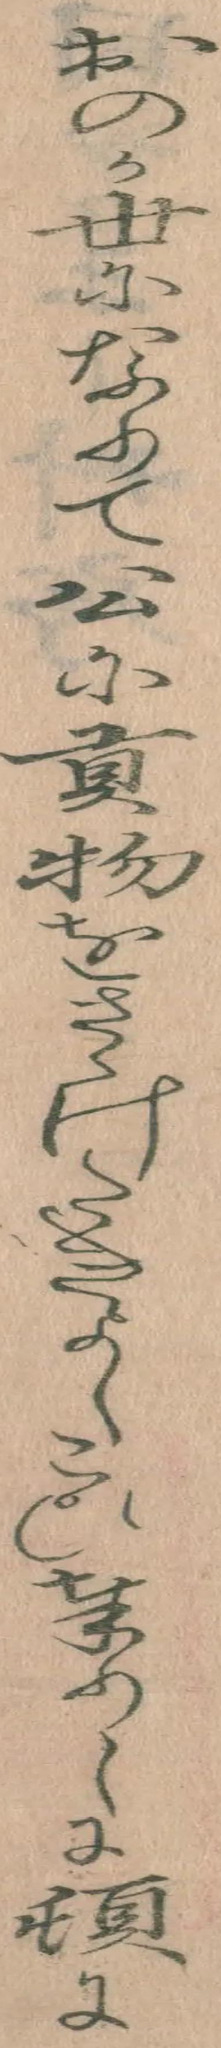おのか世になりて公に貢物をさゝけたきよしこひ奉りしに頓に
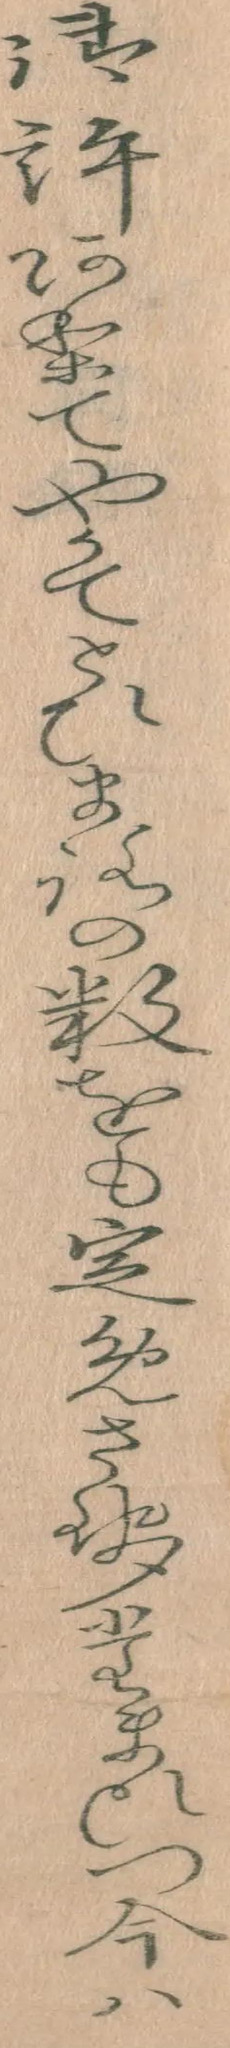御許ありてやかてとひまろの数をも定めさせたまひつ今は
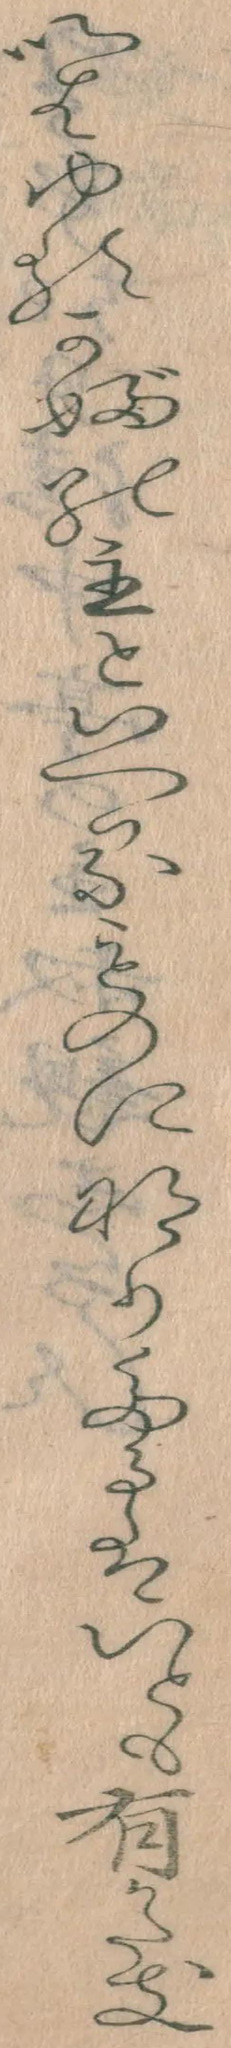いはゆるかぶの主といへるものになりたるはいとも有かたき
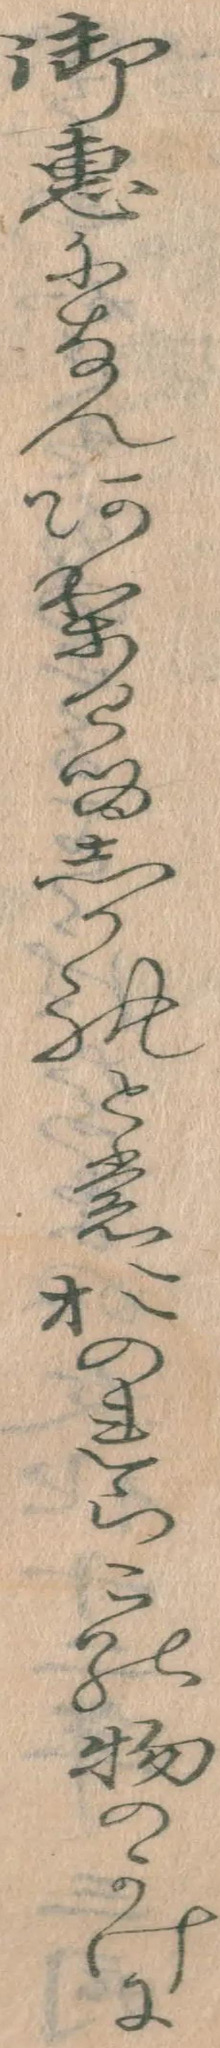御恵になんありたるしかれともおのれらこの物のかけに
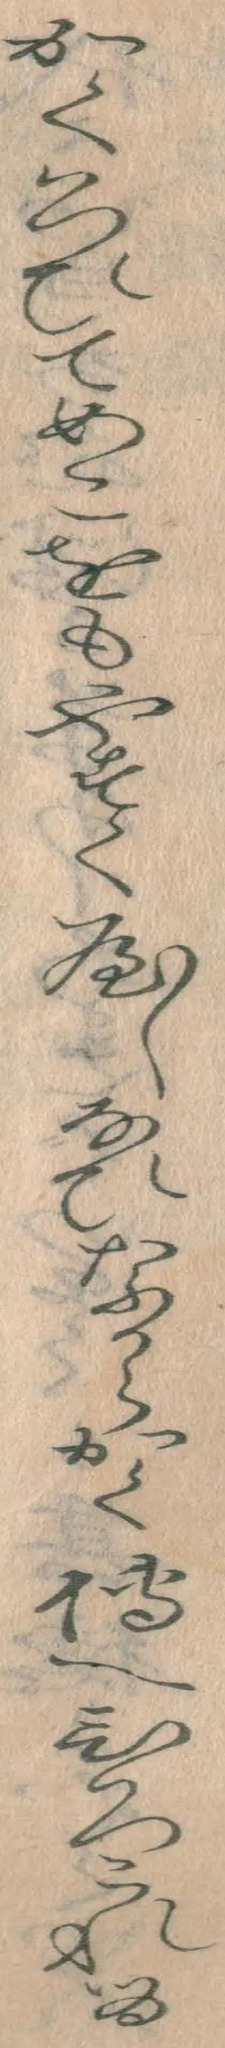かくろひてめこをもやすくやしなひなからかく伝へひろこれる
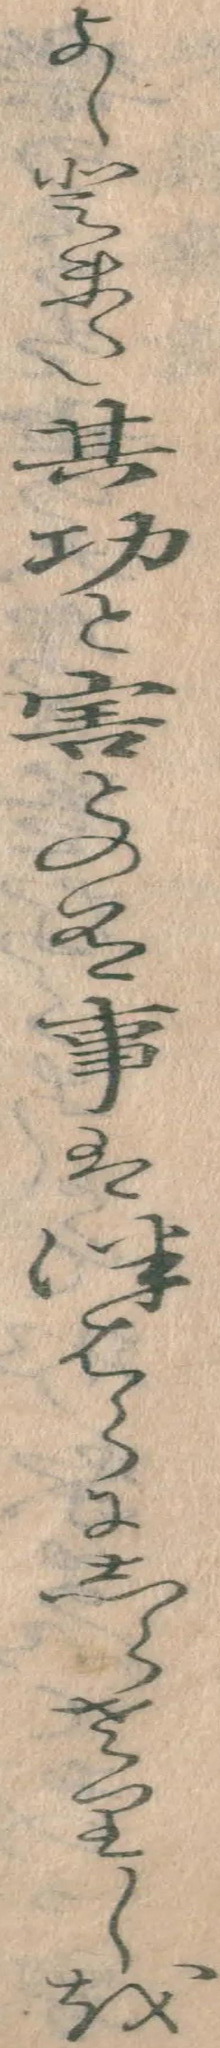よしとまた其功と害との有事はつはらにしらさりしを
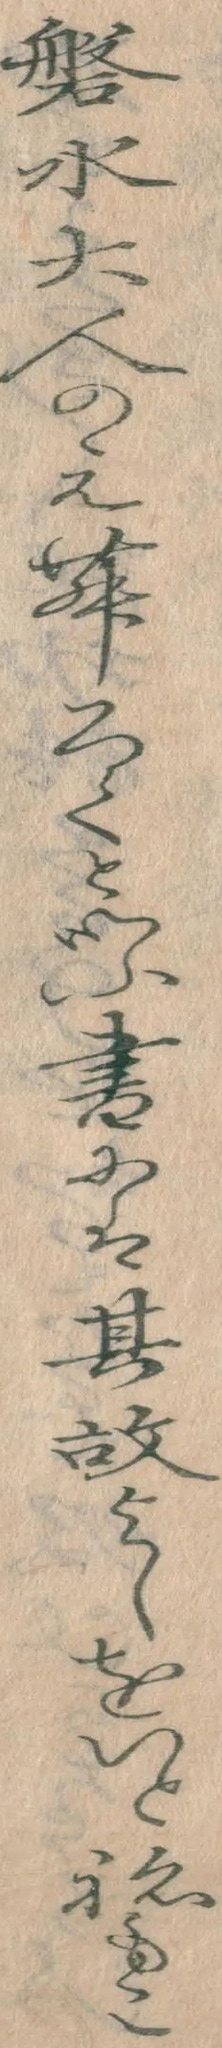磐水大人のえんろくといふ書には其故よしをいとねもこ
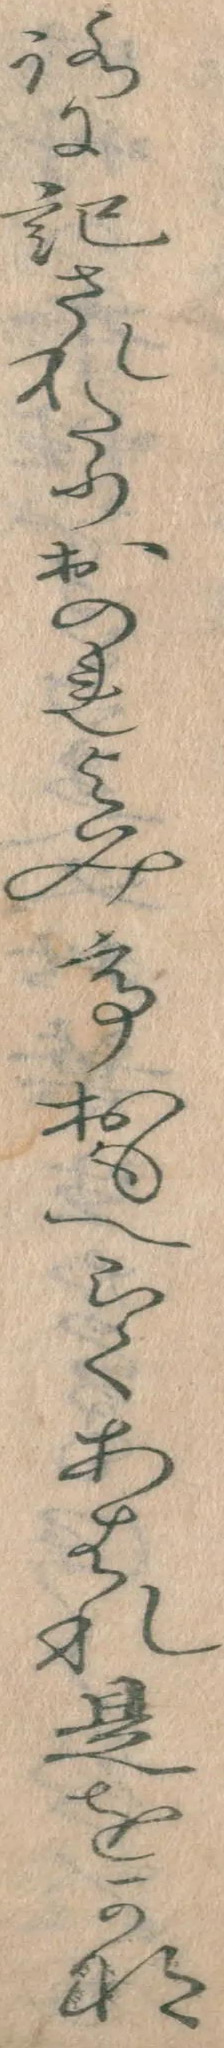ろに記されたりおのれよみておもへらくあはれ是をかな
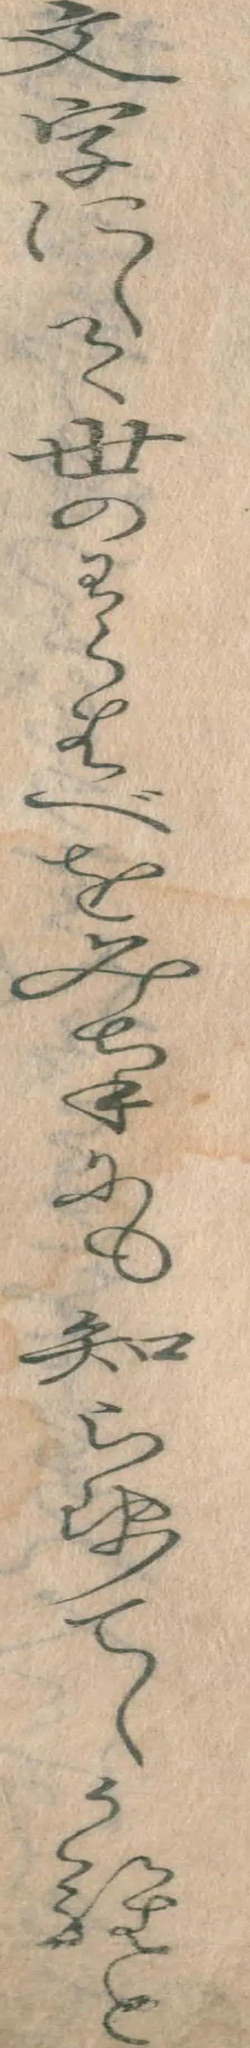文字にして世のわらはべをみちにも知らせてしかりと
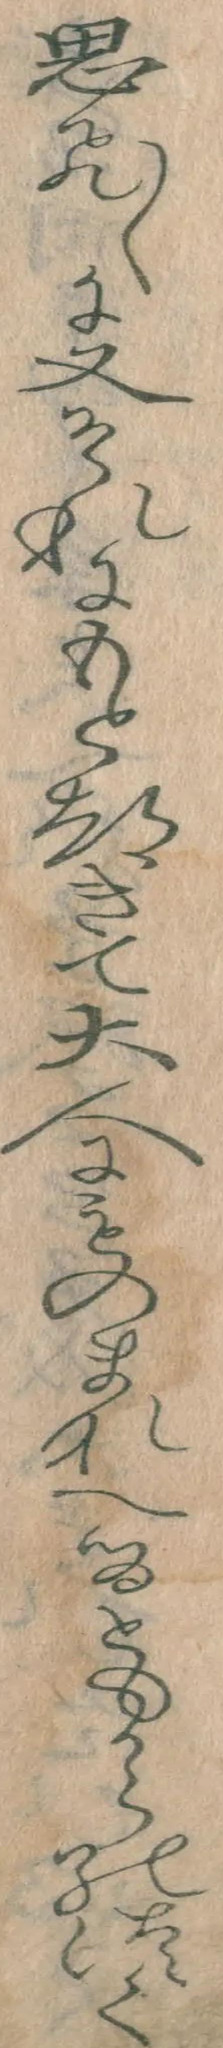思はれしに又それにもとつきて大人にものまれへるともからのつく

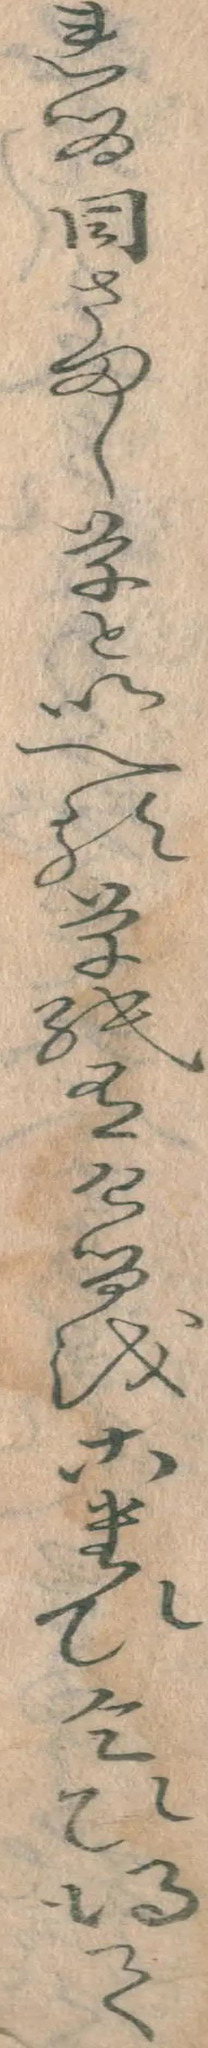れる目さまし草といへる草紙有けるをこきひ乞ひ得て
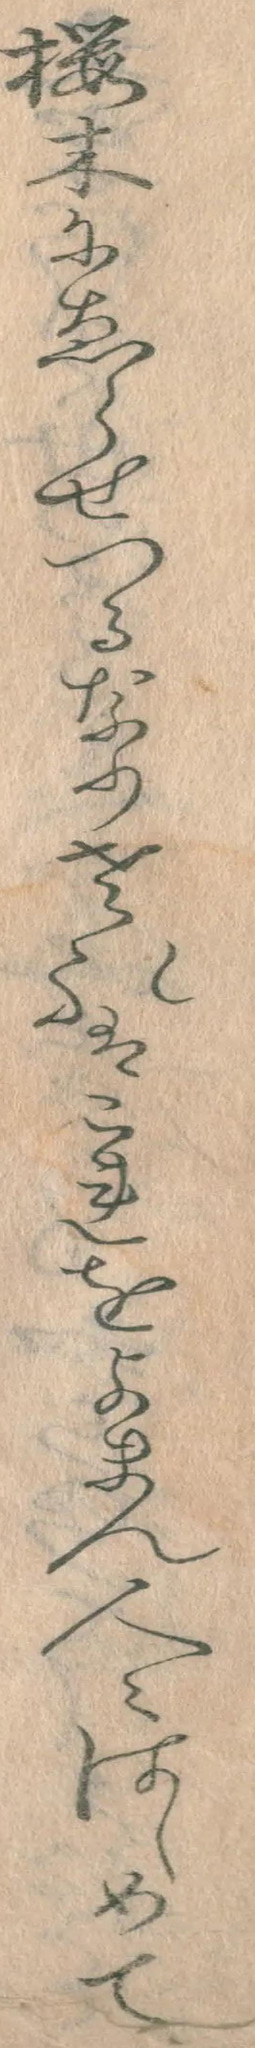桜木にゑらせつるなりされはこれをよまん人々はしめて
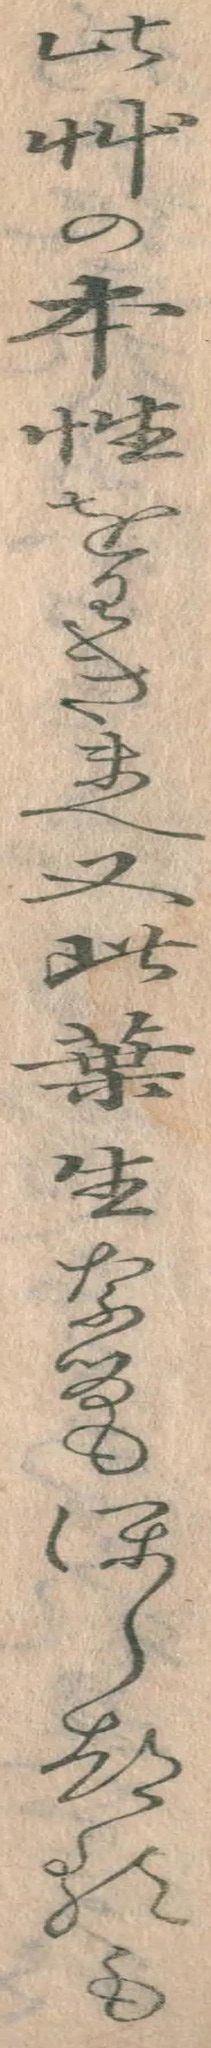此艸の本性をわきまへ又此葉生なるもほしつるも
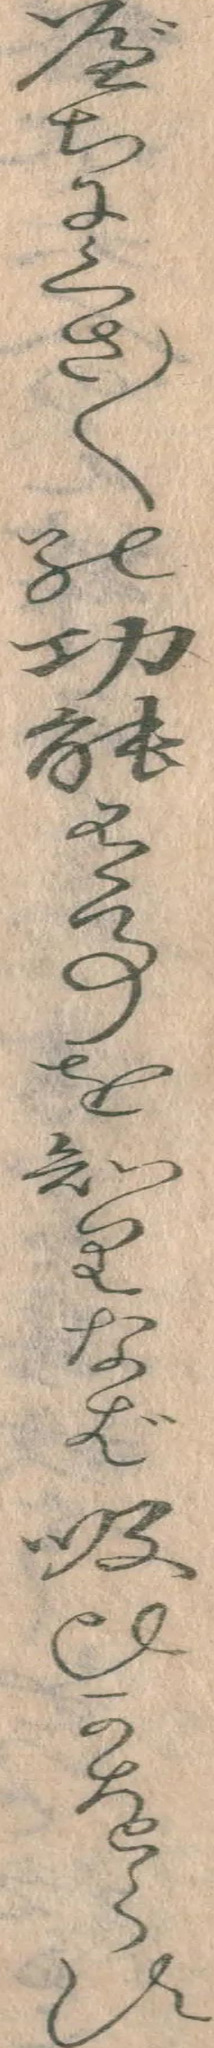べちにくさ〳〵の功能有事を知りなば吸ひかならす
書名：目さまし草
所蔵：国立国会図書館 National Diet Library, JAPAN
